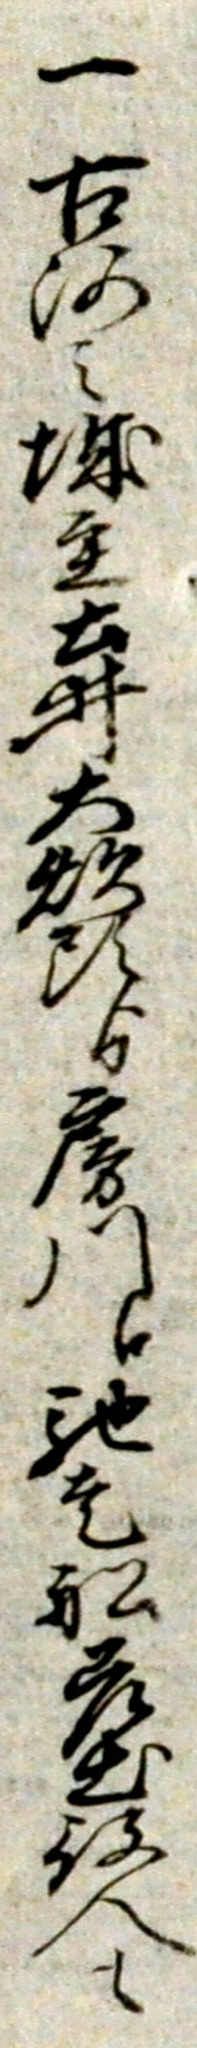一古河之城主土井大炊頭ゟ房川江馳走船差出役人も
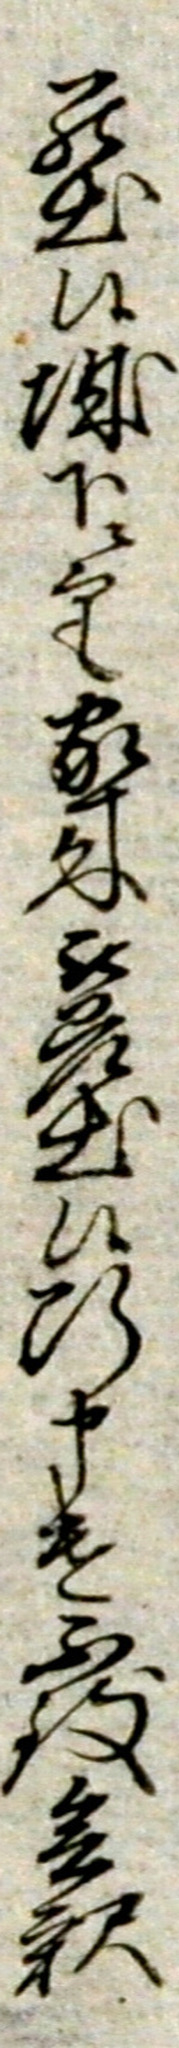罷出候城下ニ而も家来被差出候断申遣不致会釈
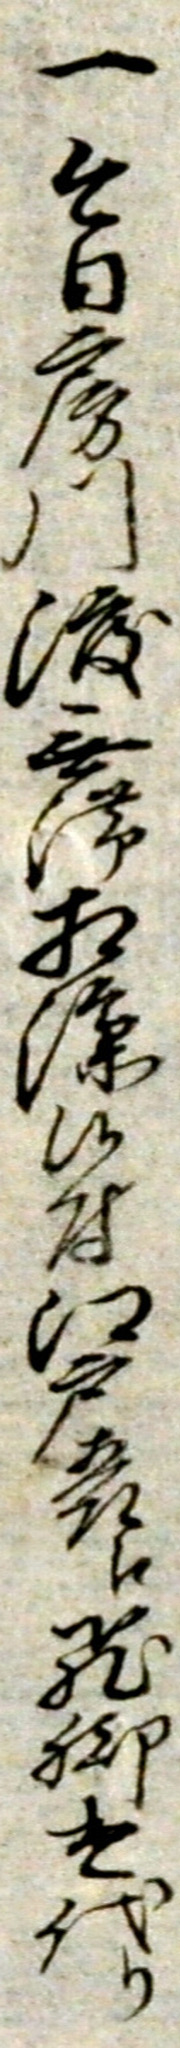一今日房川渡無滞相済候付江戸表江飛脚遣代り
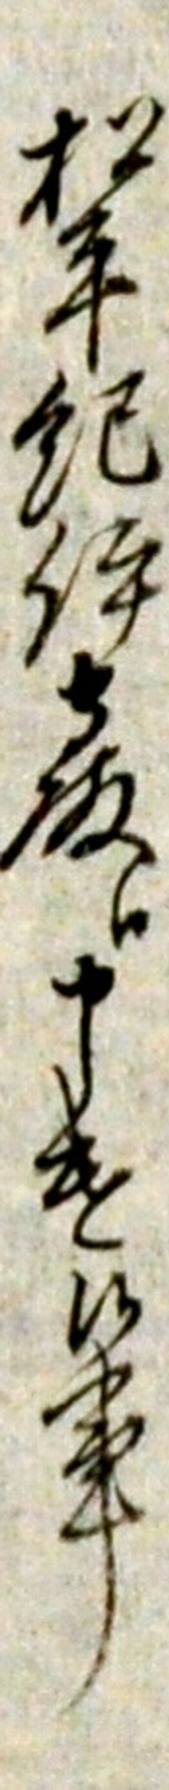松平紀伊守殿江申遣候事
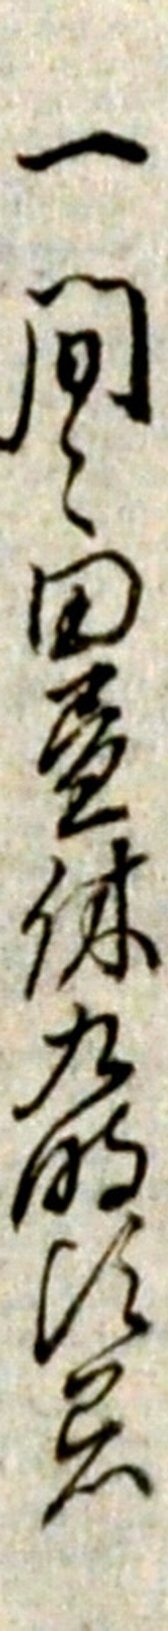一間々田昼休九時頃着
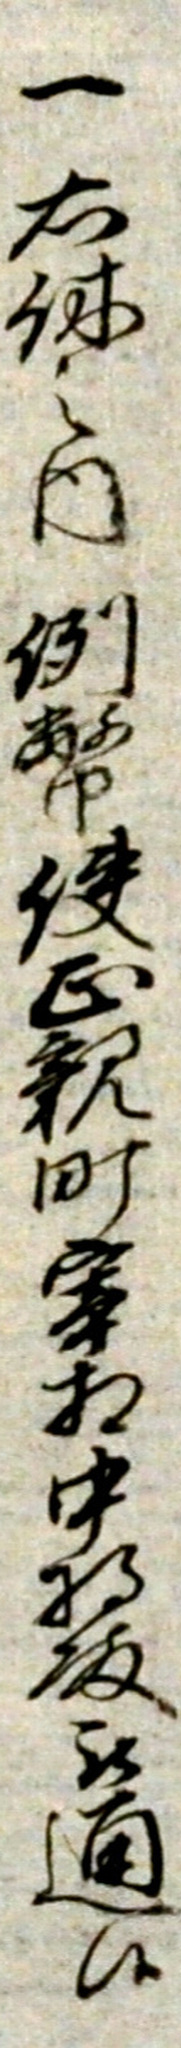一右休之内例幣使正親町宰相中将殿被通候
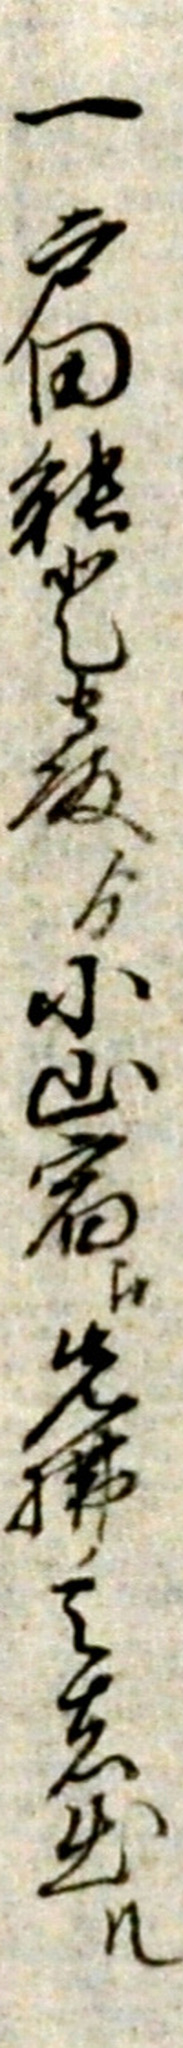一戸田能登守殿ゟ小山宿江先払之者出ル
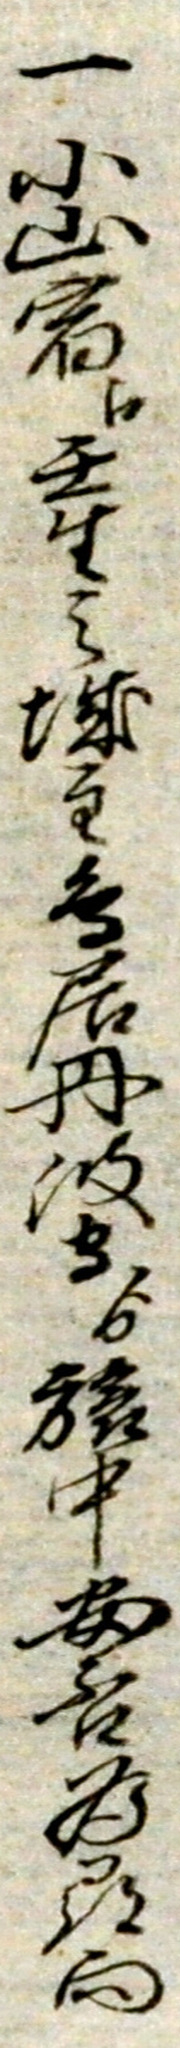一小山宿江壬生之城主鳥居丹波守ゟ旅中安否為尋向
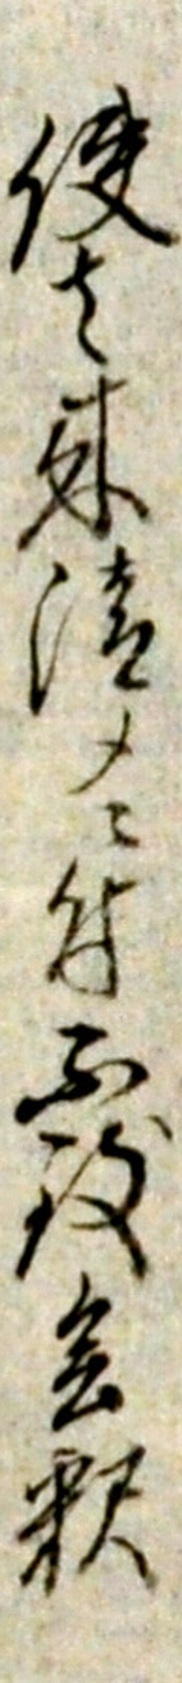使者来清メニ付不致会釈
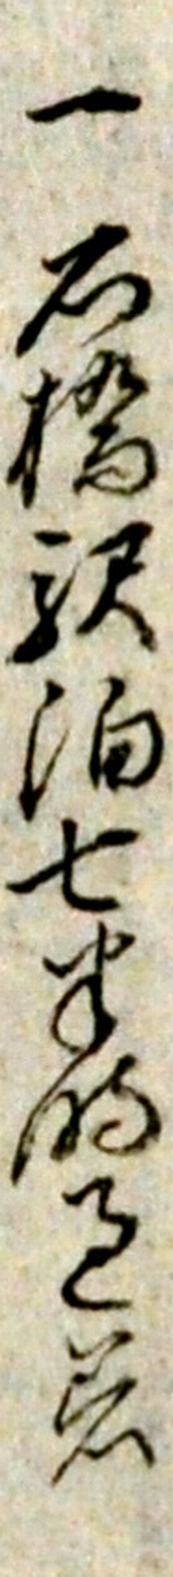一石橋駅泊七半時過着
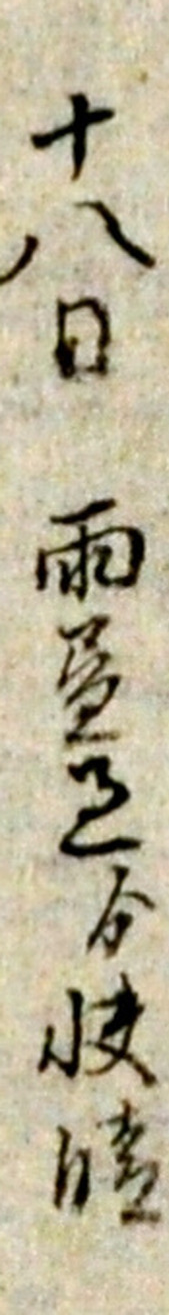十八日雨昼過ゟ快晴
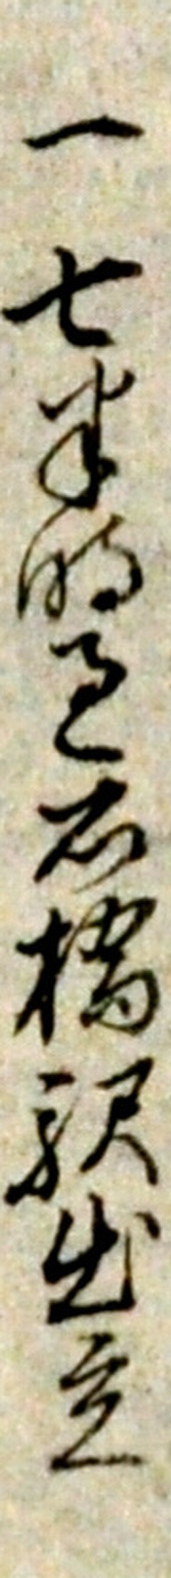一七半時過石橋駅出立
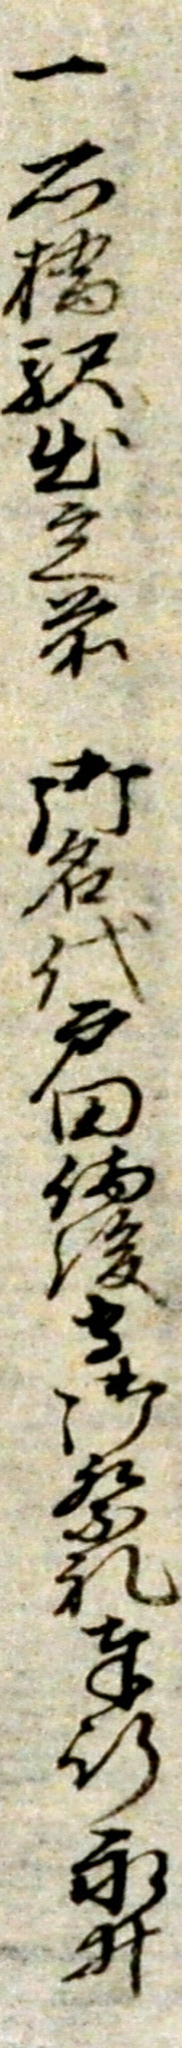一石橋駅出立前御名代戸田備後守御祭礼奉行永井
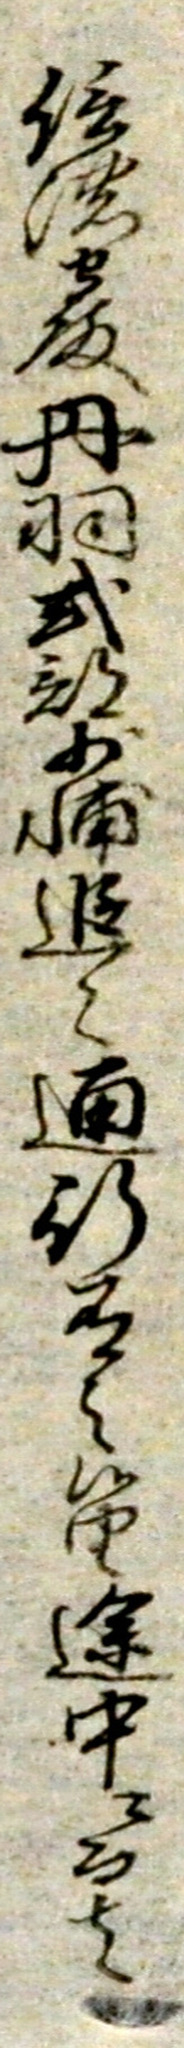信濃守殿丹羽式部少輔追々通行有之候由途中ニ而者
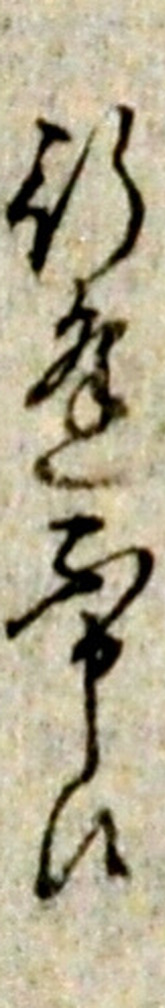行逢不申候
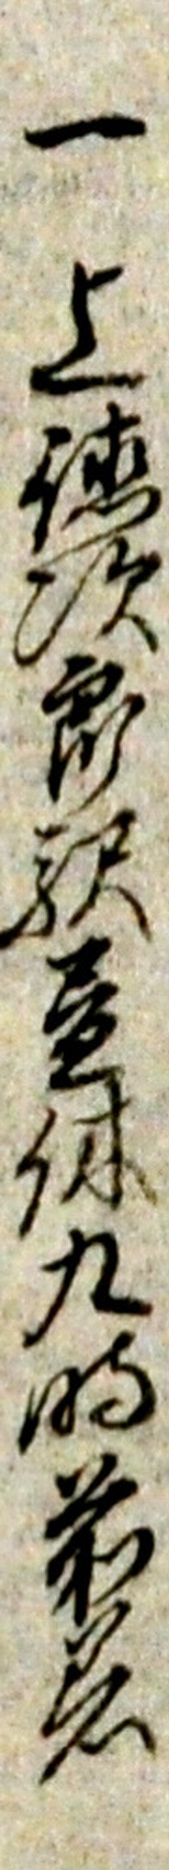一上徳次郎駅昼休九時前着
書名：日光御名代相勤候節ノ留
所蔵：伊那市立高遠町図書館・合同会社AMANE
